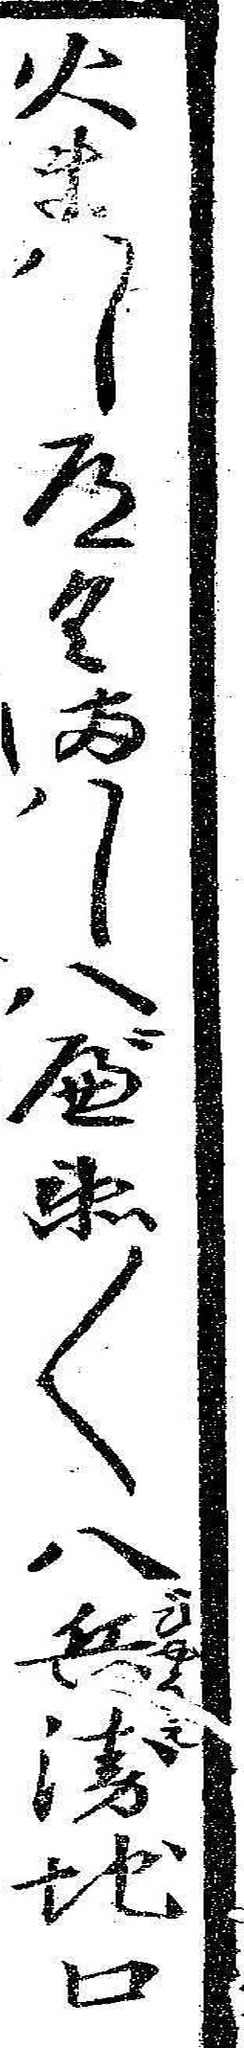火まはし道具まはし八べ衛〱八兵衛地口
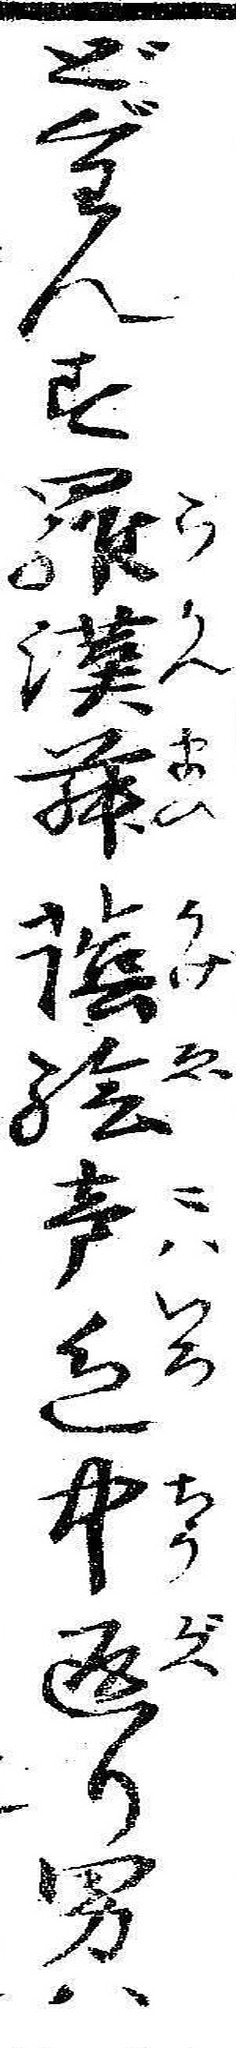どぐわんす羅漢舞蔭絵声色中返り男は
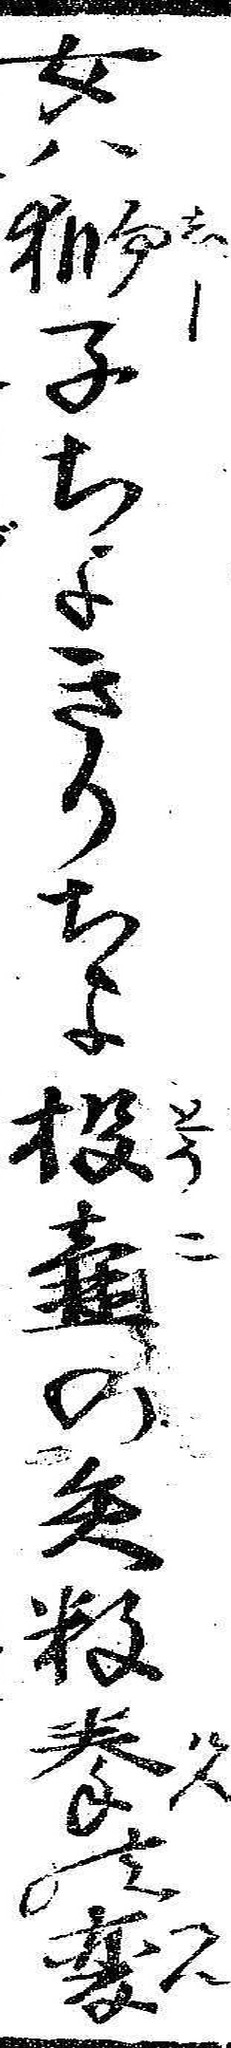女は獅子ちよきりちよ投壷の矢数拳の変
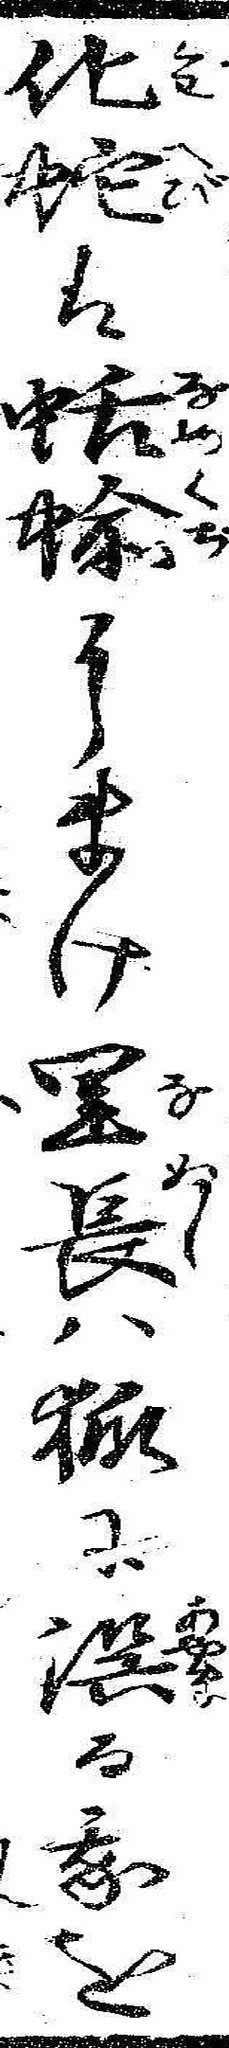化蛇は蛞蝓にまけ里長は狐に誤る我を
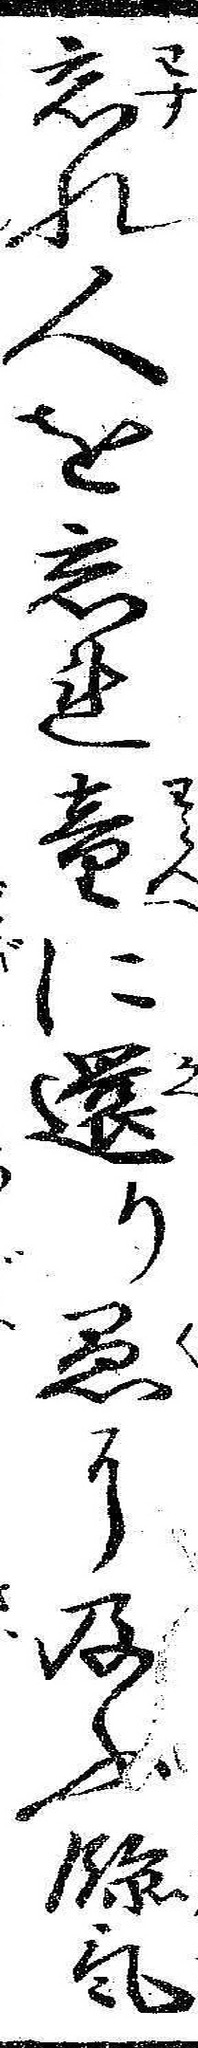忘れ人を忘れ童に還り愚に及ふ臨気
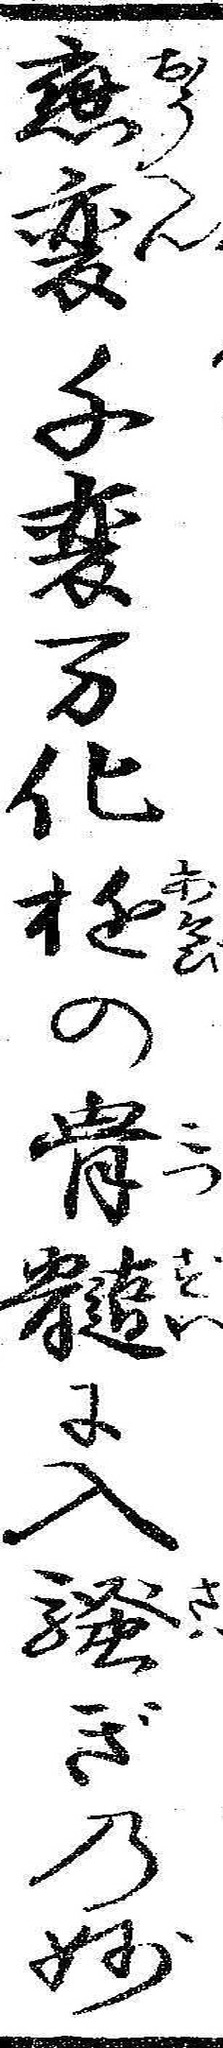応変千変万化遊の骨髄に入騒ぎの妙
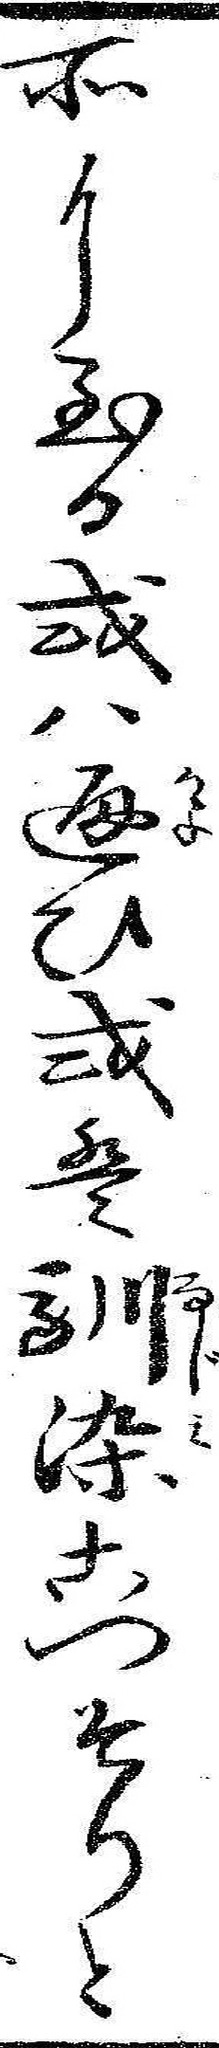所に至る或は通ひ或は馴染こつそりと
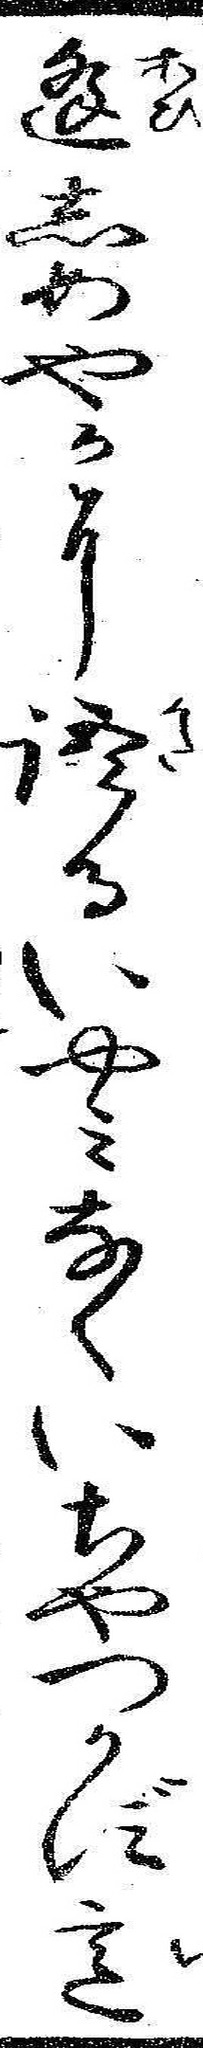逢しめやかに語るいやみなくいちやつかず意
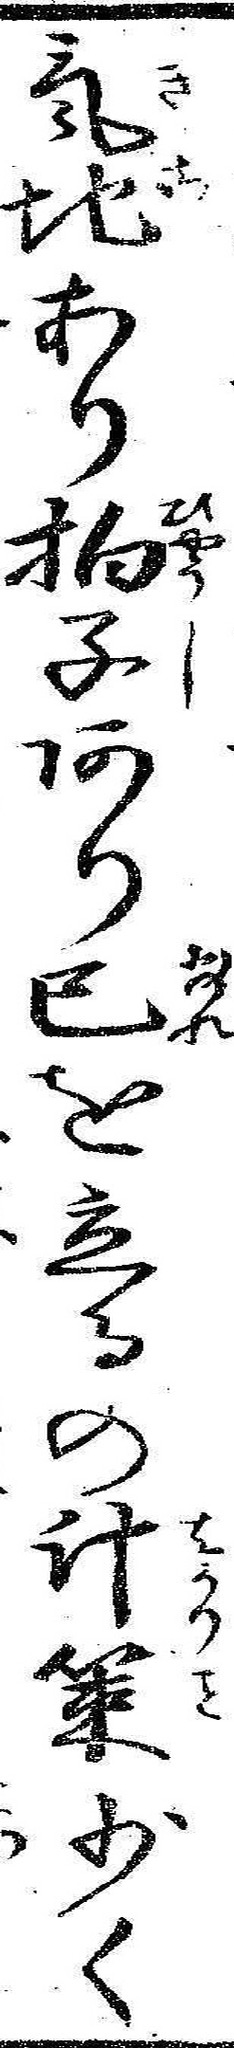気地あり拍子あり己を立るの計策少く
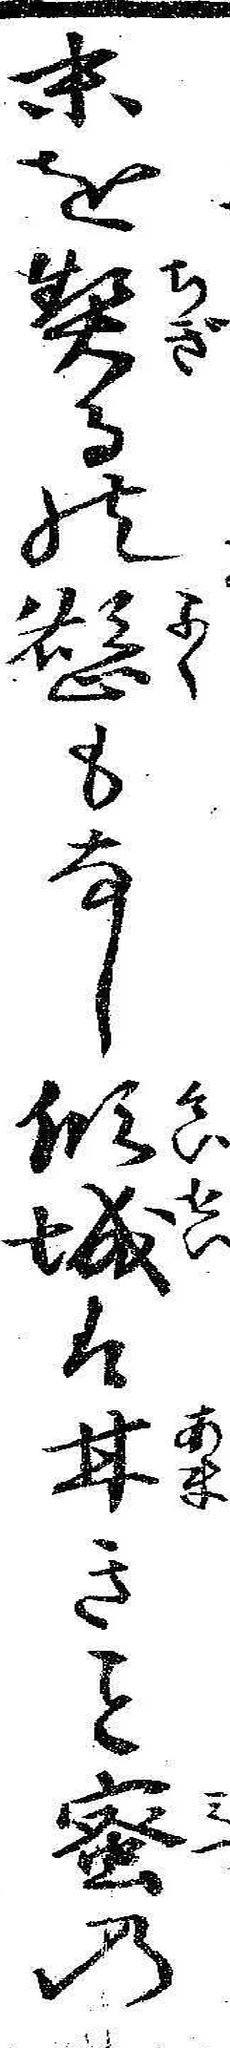末を契るの慾もなし傾城は甘き蜜の

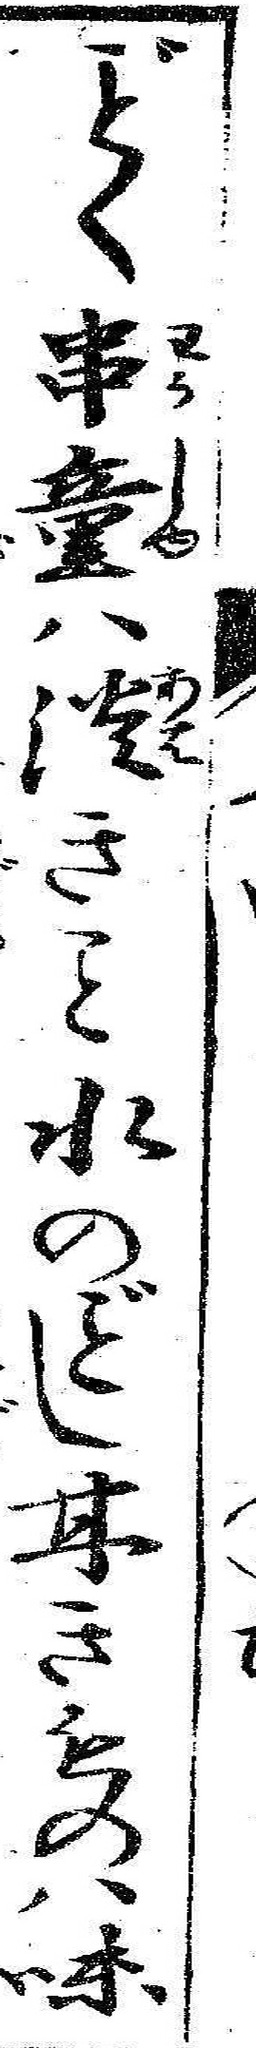ごとく串童は淡きこと水のごとし甘きものは味
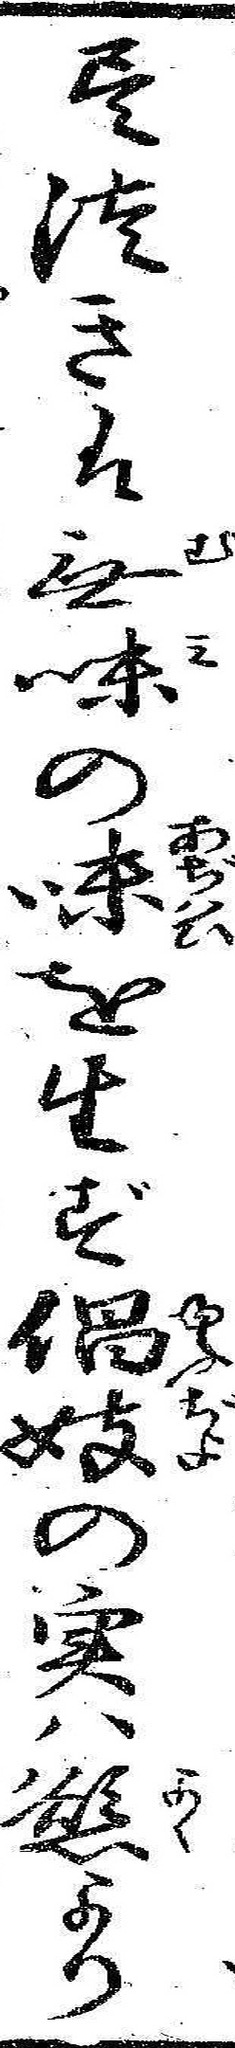尽つきは無味の味を生ず倡妓の実は慾より
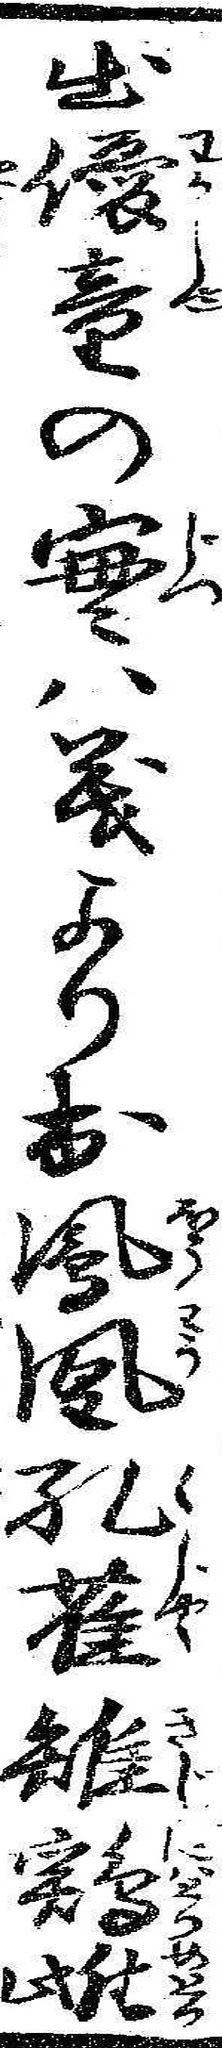出優童の実は義より出鳳凰孔雀雉鶏雌
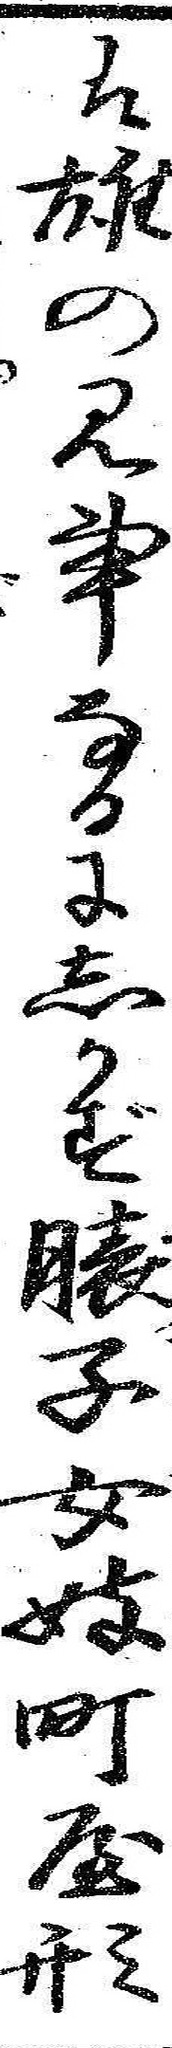は雄の見事なるにしかず倡子女妓町屋形
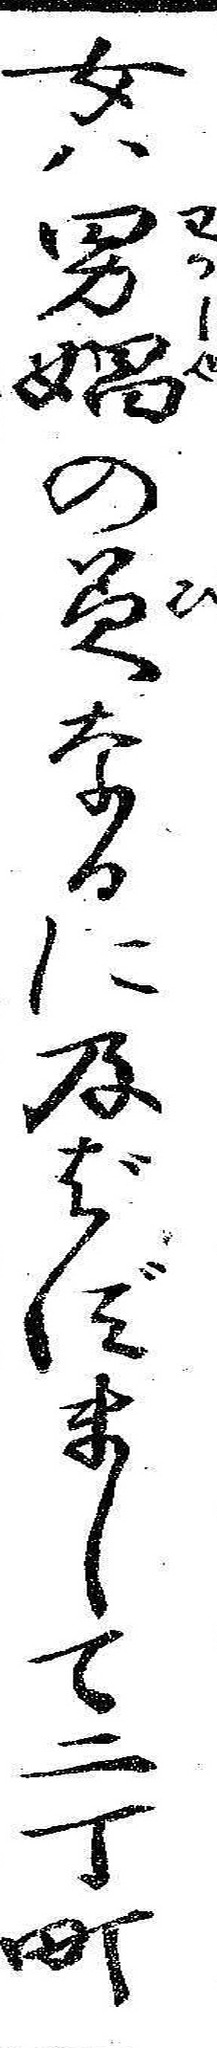女は男娼の美なるに及ばずまして二丁町
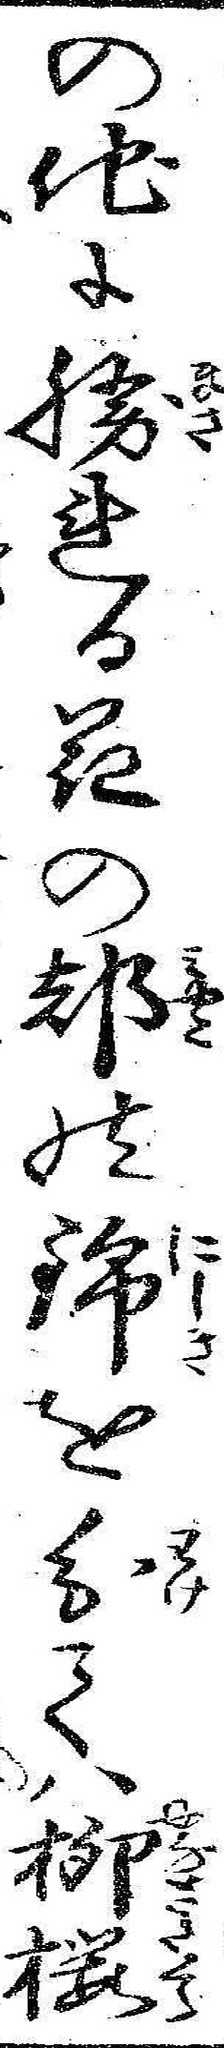の他に勝れる花の都の錦を分ては柳桜
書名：根無草後編
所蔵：国文学研究資料館
